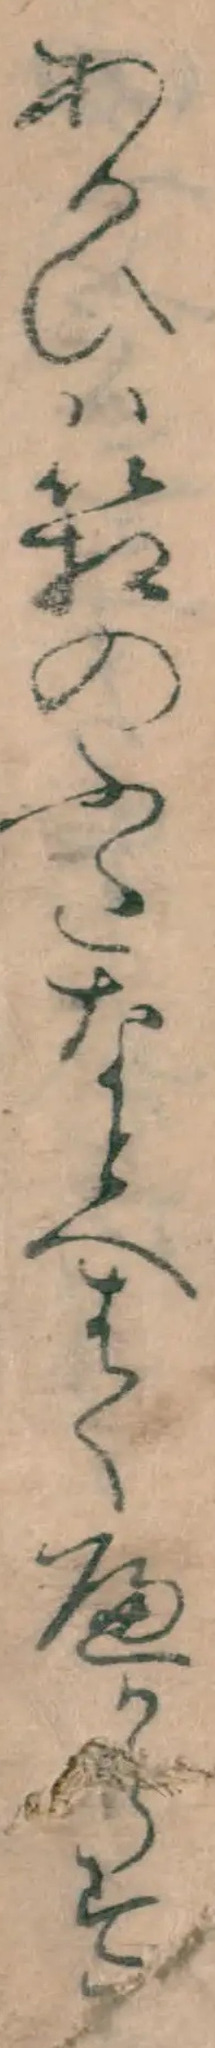あるひは箱のふたなとへはくへからす

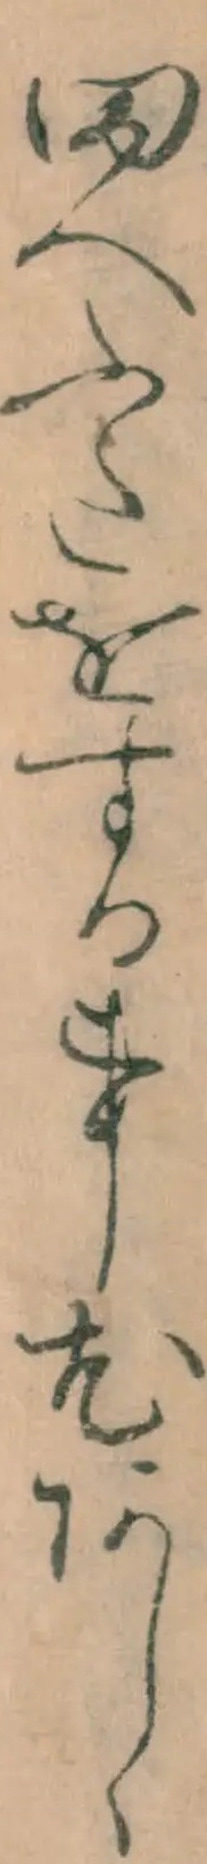田へふたをする事尤あしく
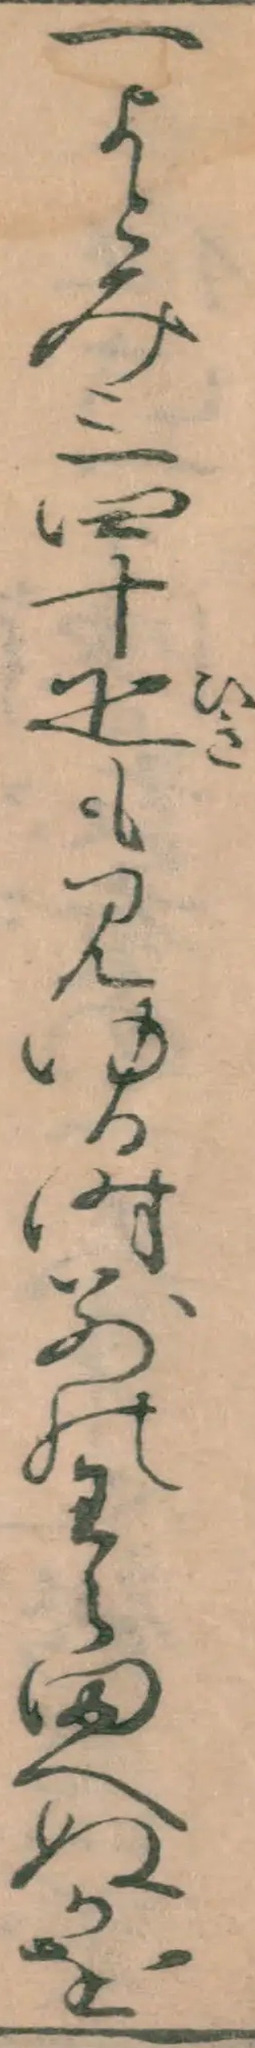一よとみ三四十疋も見ゆる時別のわら田へぬかを
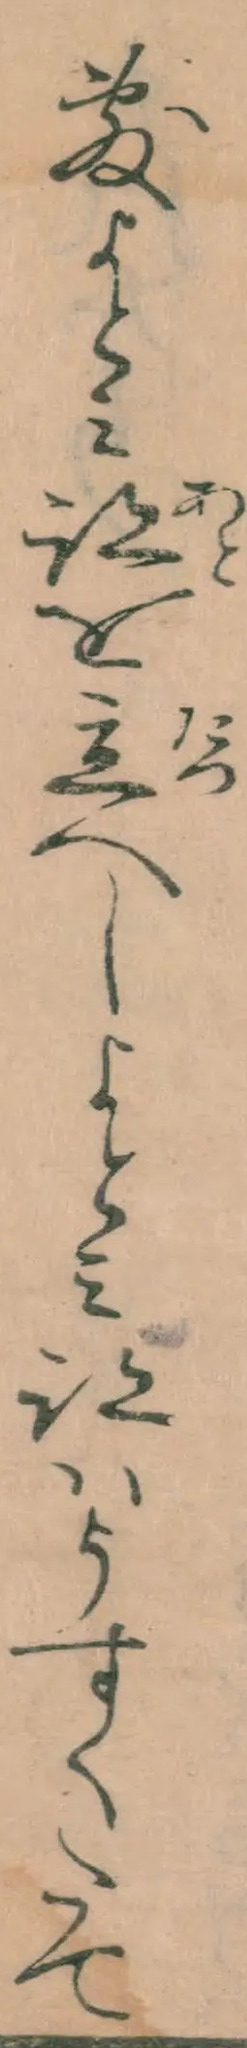敷よとみ跡を立へしよとみ跡はうすくたて
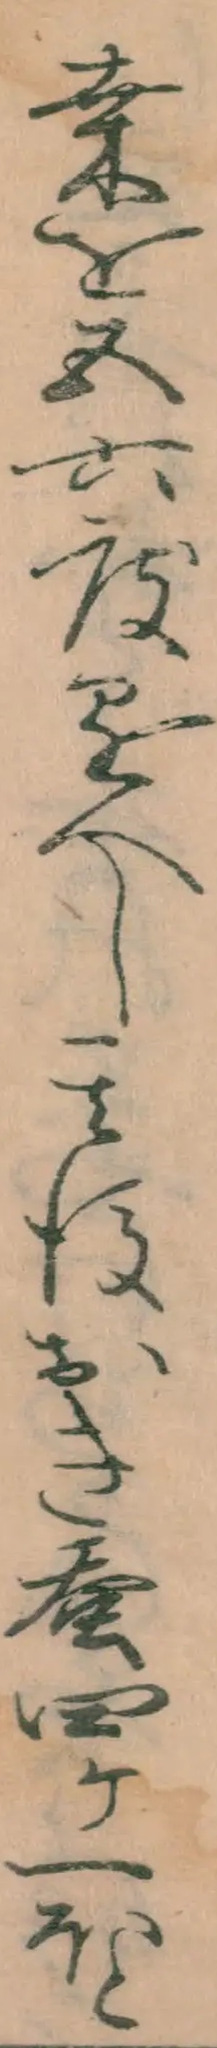桑を五六度懸へし其後おき蚕四ヶ一ほと
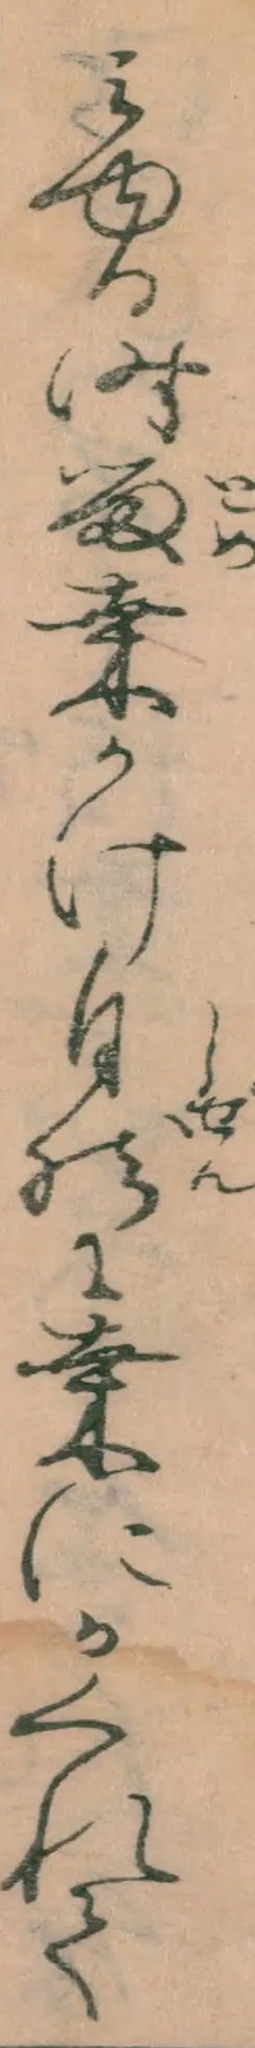みゆる時留桑かけ自然に桑にかくれて
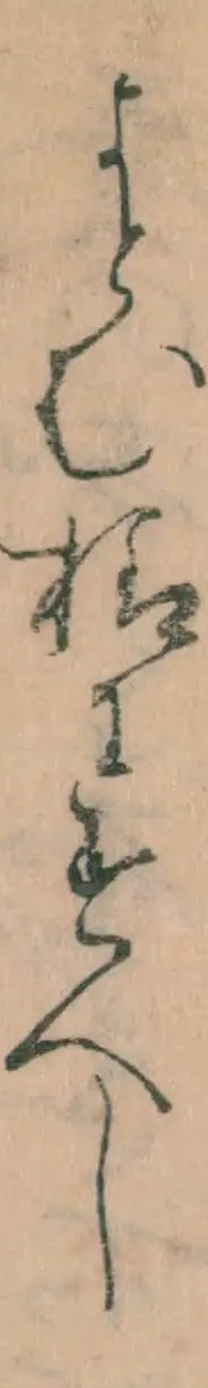よとむ様にすへし
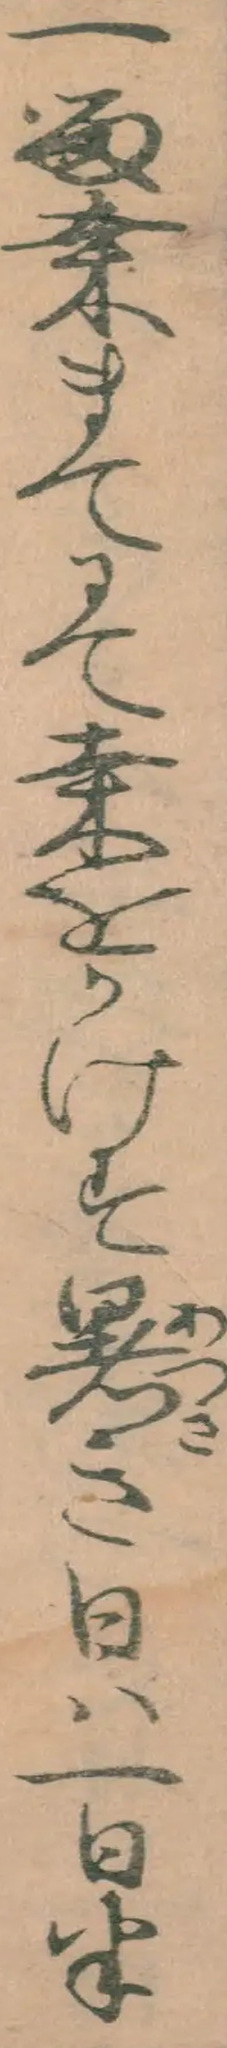一留桑まてにて桑をかけす暑き日は一日半
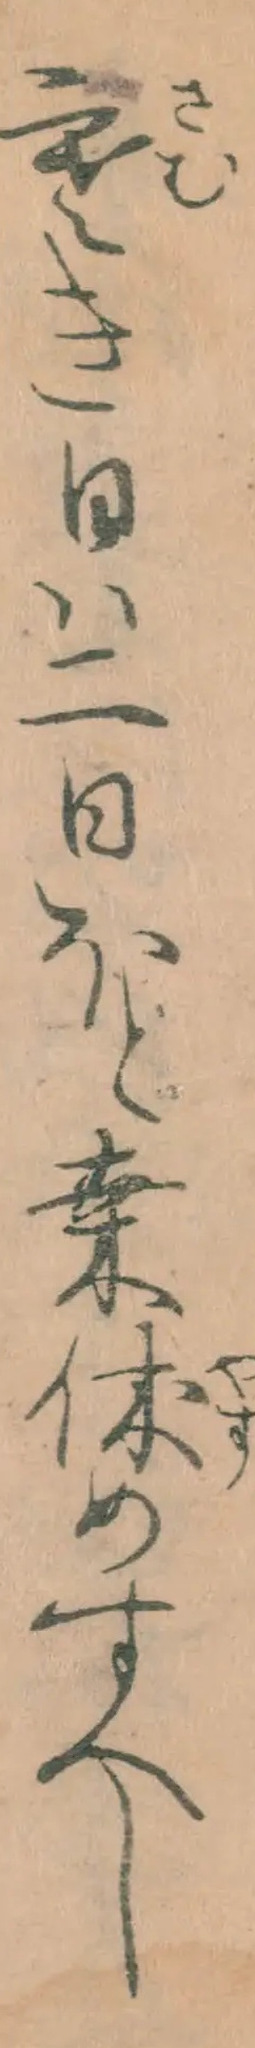寒き日は二日ほど桑休めすへし
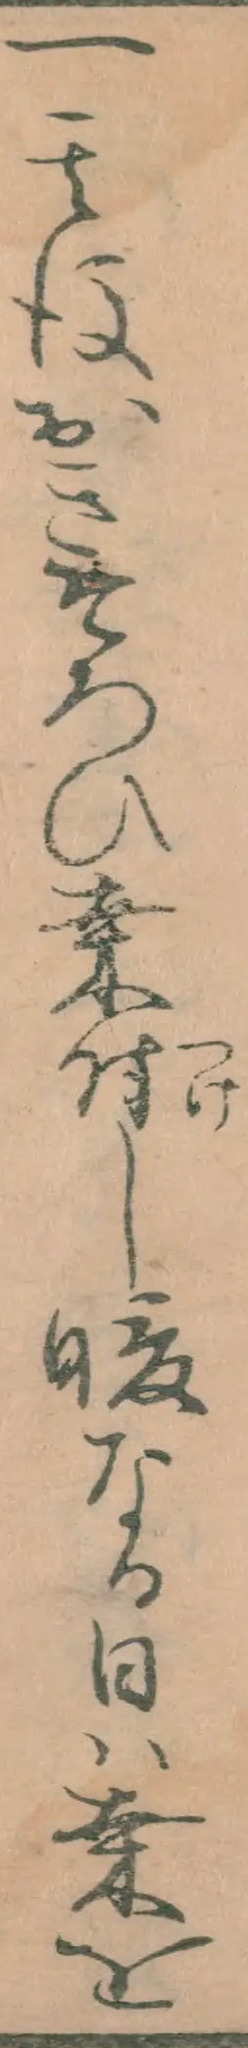一其後おきそろひ桑付し暖なる日は桑を
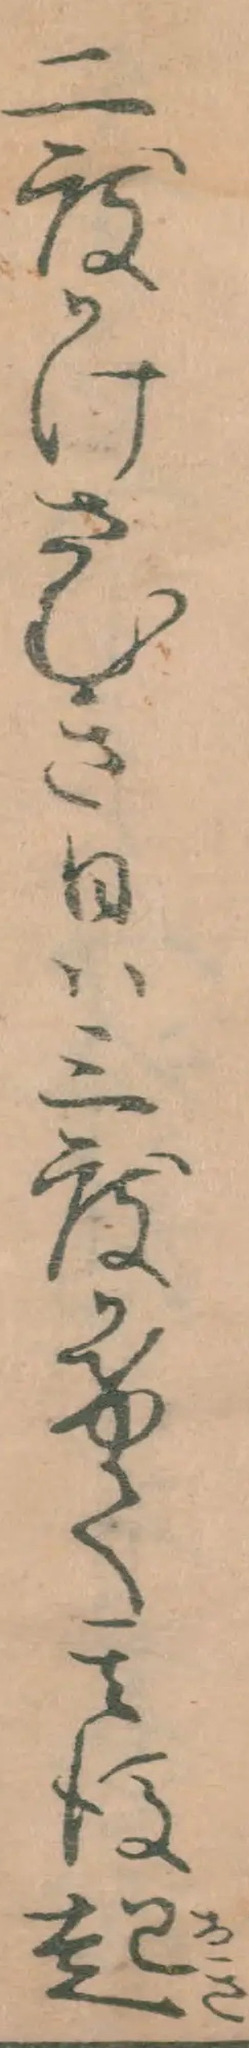二度かけさむき日は三度かけて其後起
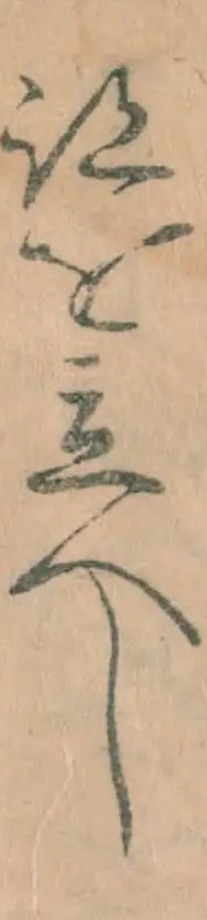跡を立へし
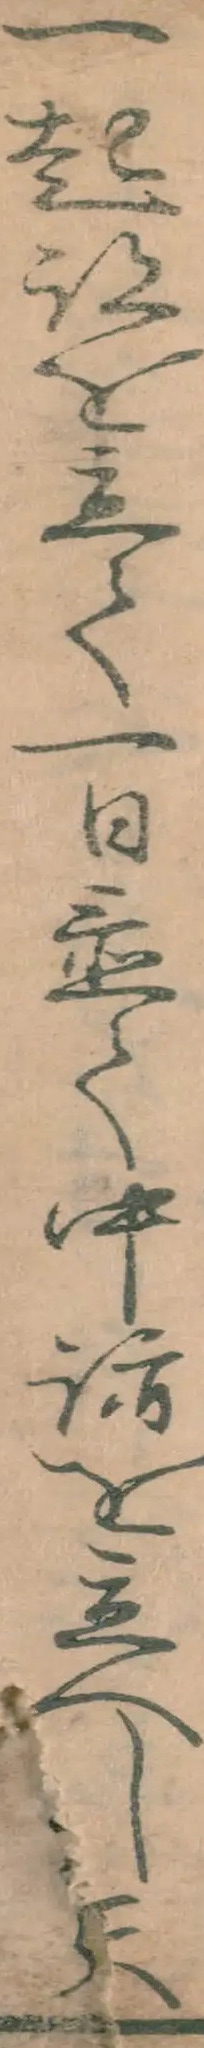一起跡を立て一日置て中跡を立へし
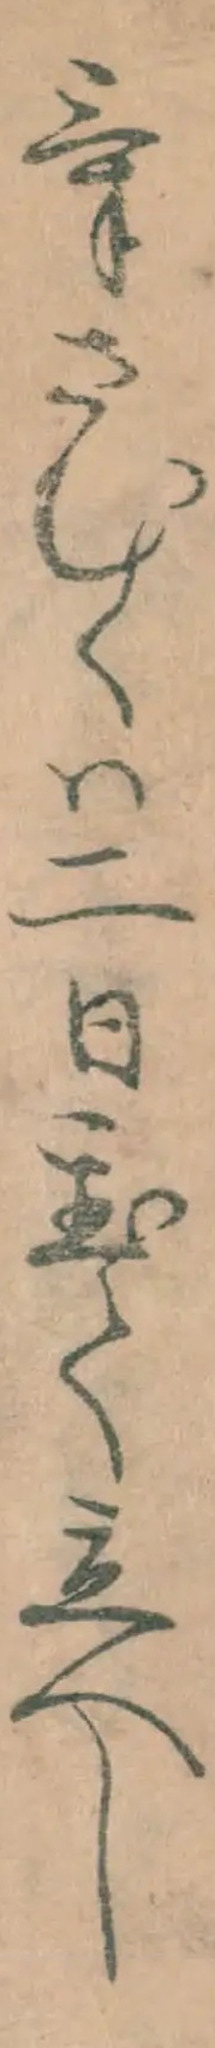気さむくは二日置て立へし

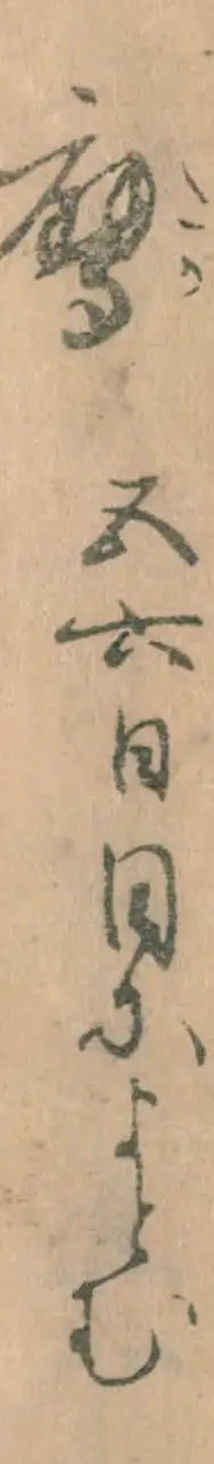鷹五六日目によとむ
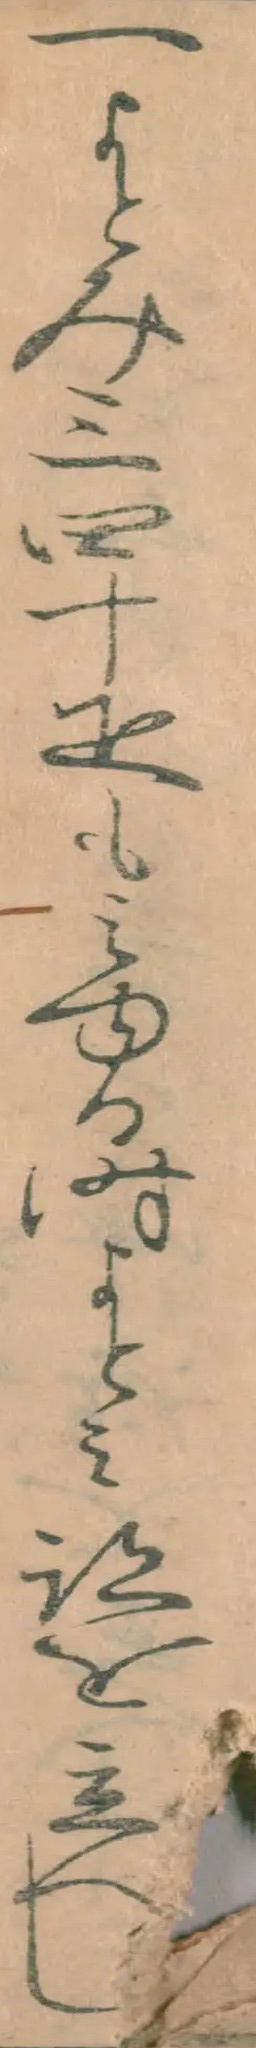一よとみ三四十疋もみゆる時よとみ跡を立へし
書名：養蚕手引
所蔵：国立国会図書館 National Diet Library, JAPAN
